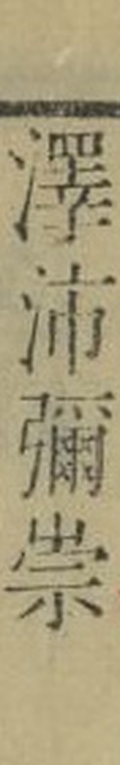澤沛彌崇
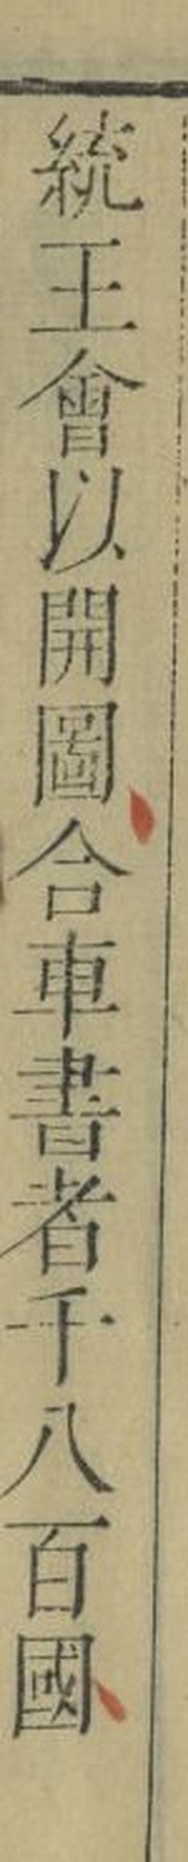統王會以開圖合車書者千八百國
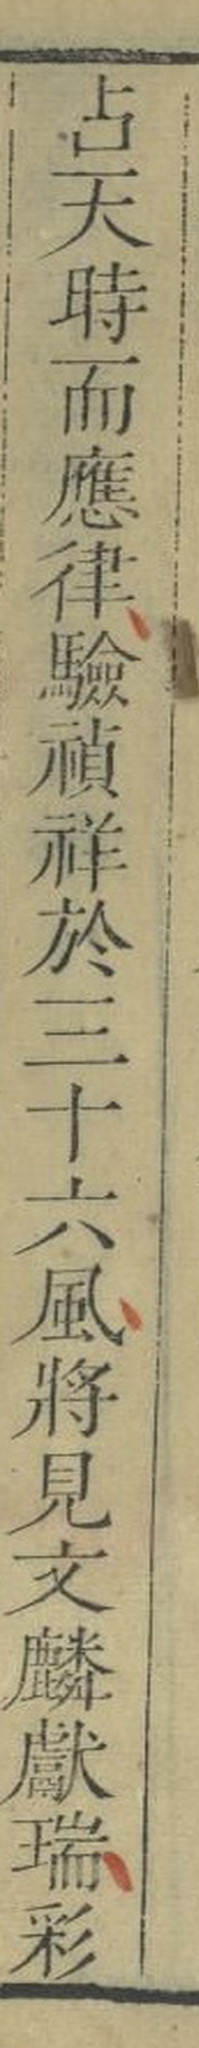占天時而應律驗禎祥於三十六風將見文麟獻瑞彩
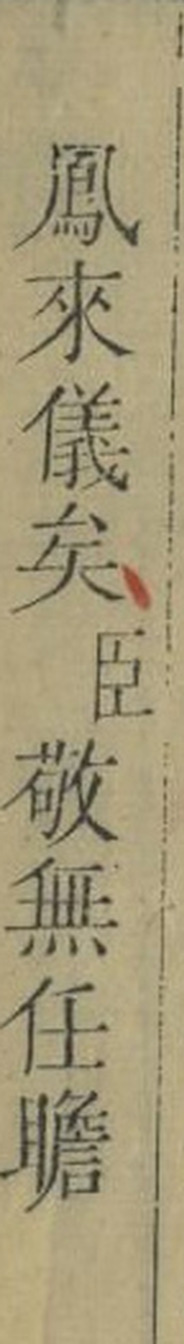鳳來儀矣臣敬無任瞻

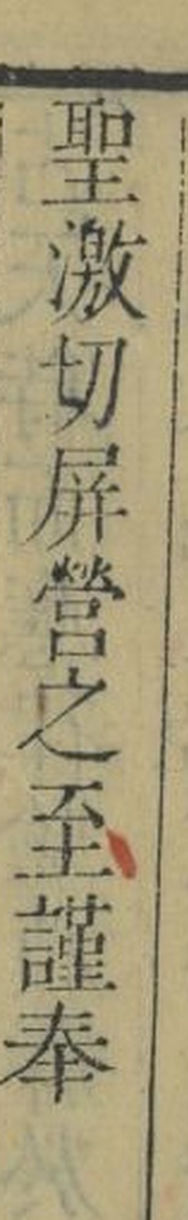聖激切屏營之至謹奉
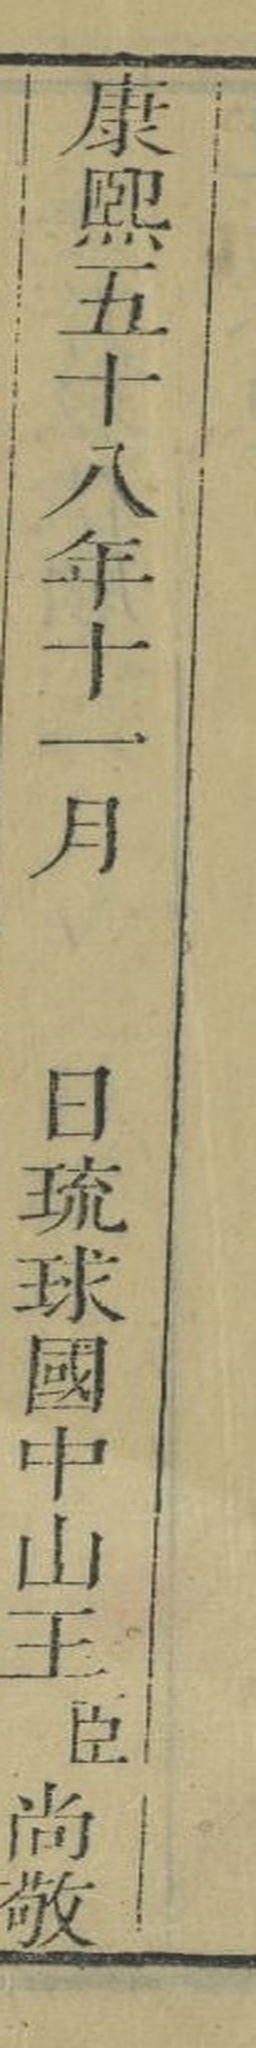康煕五十八年十一月日琉球國中山王臣尚敬
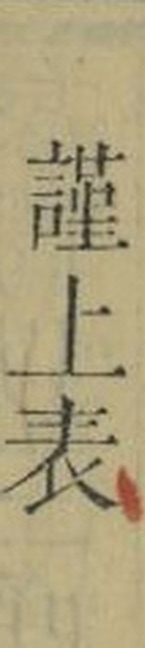謹上表
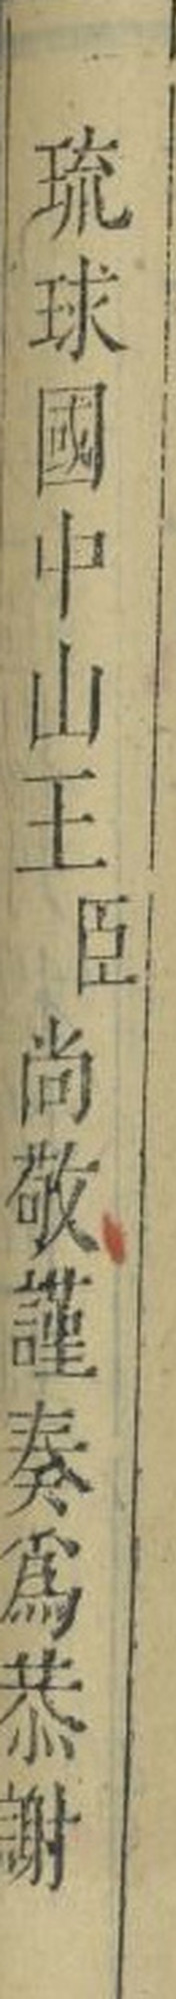琉球國中山王臣尚敬謹奏爲恭謝
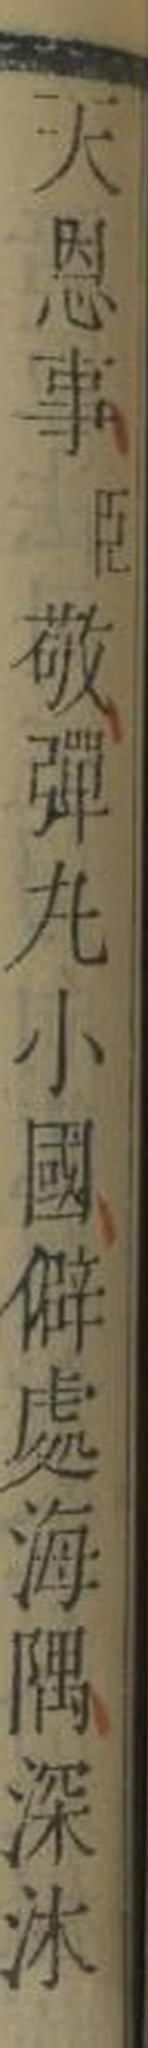天恩事臣敬彈丸小國僻處海隅深沐
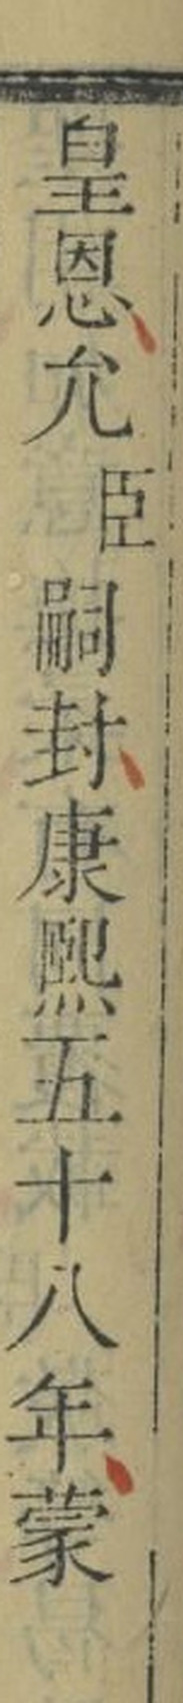皇恩允臣嗣封康煕五十八年蒙
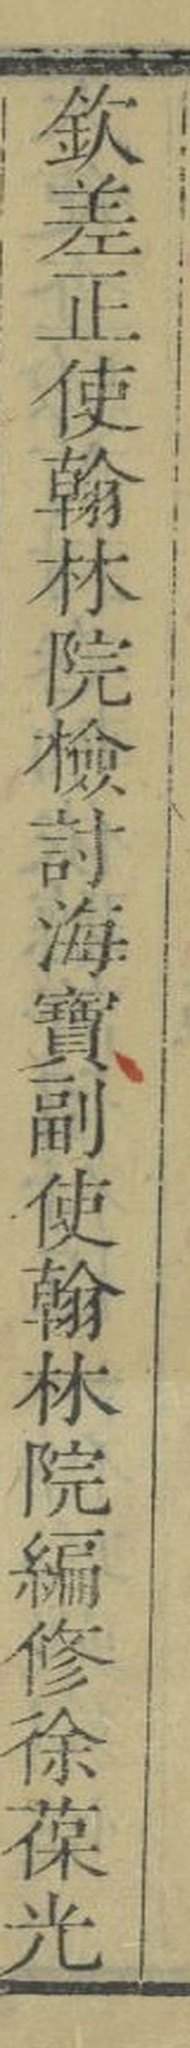欽差正使翰林院檢討海寶副使翰林院編修徐葆光
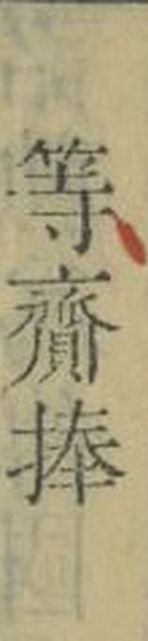等齎捧
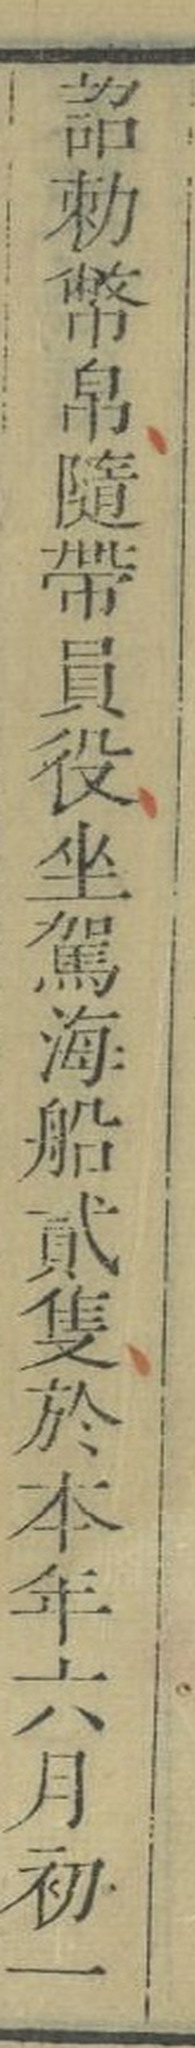詔勅幣帛隨帶員役坐駕海船貳隻於本年六月初一
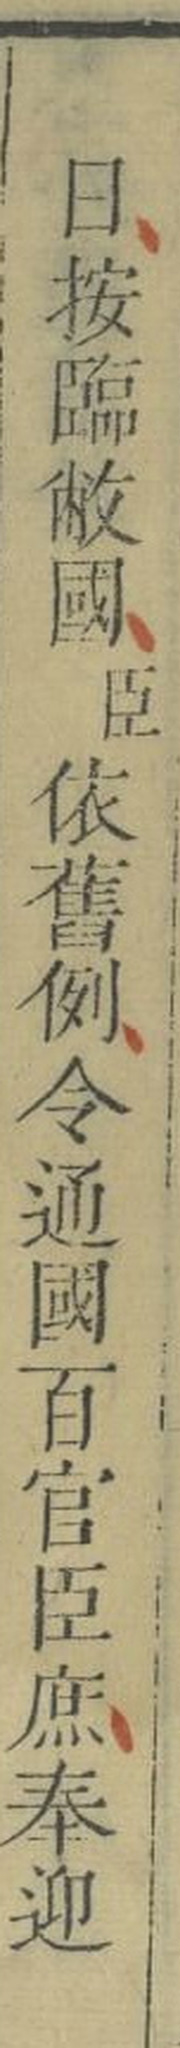日按臨敝國臣依舊例令通國百官臣庶奉迎
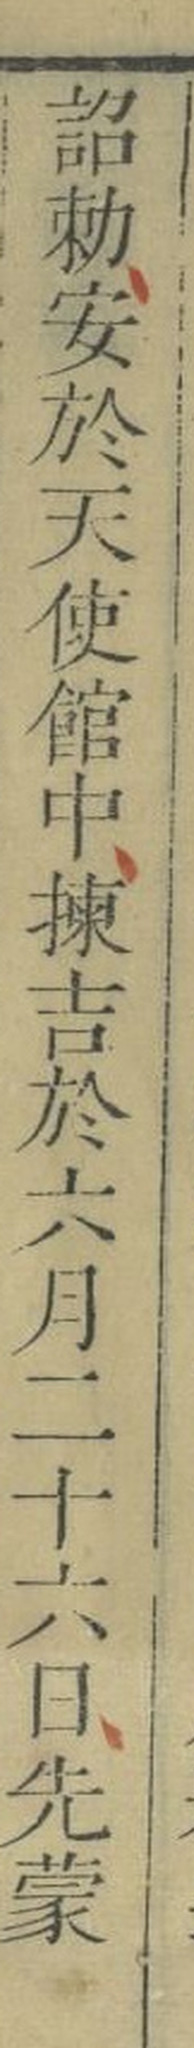詔勅安於天使館中揀吉於六月二十六日先蒙
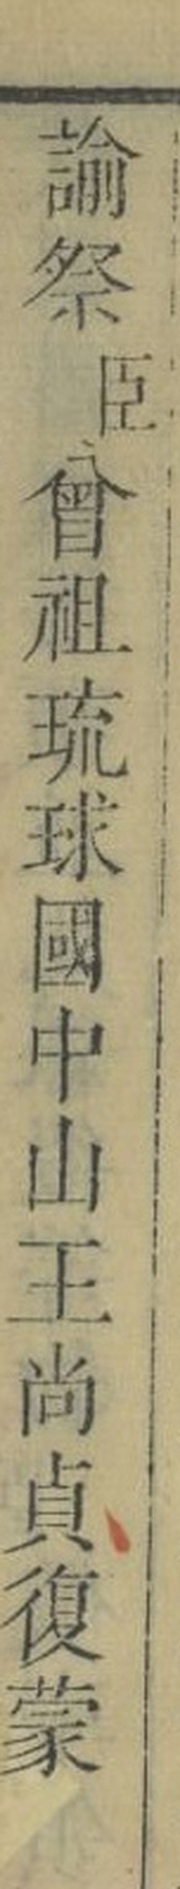諭祭臣曾祖琉球國中山王尚貞復蒙
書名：中山伝信録 巻一、巻二
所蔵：University of the Ryukyus Library
